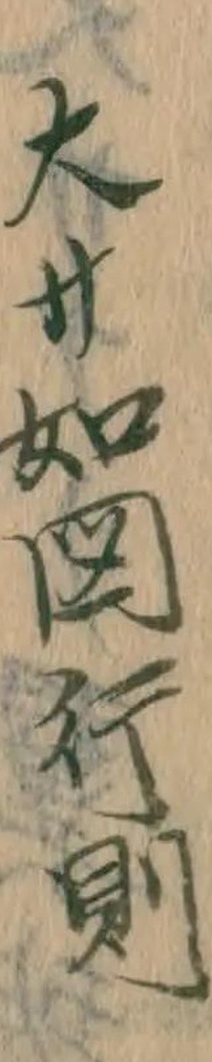大サ如図行則
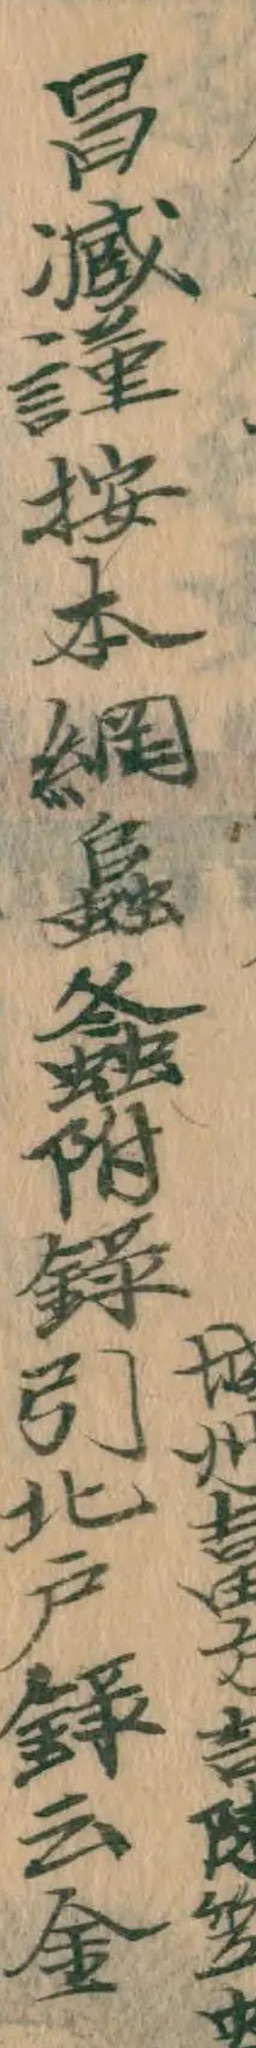昌臧謹按本綱𧒂螽附録引北戸録云金
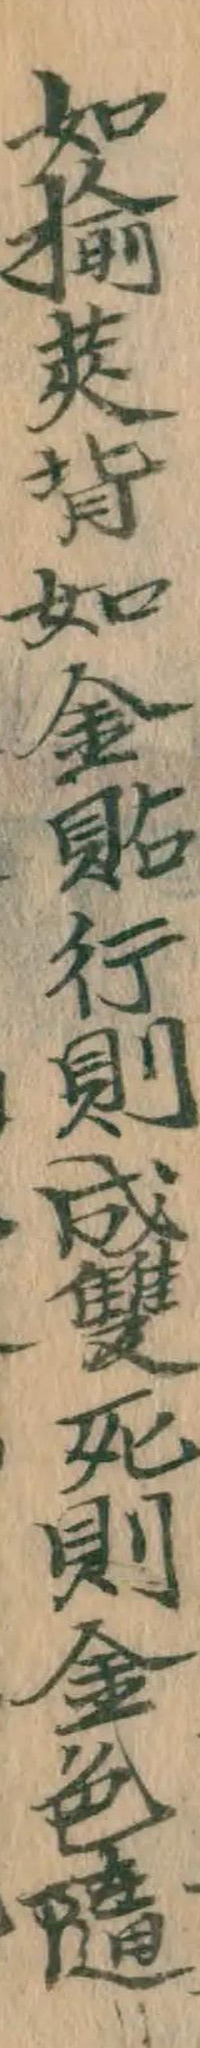如楡莢背如金貼行則成雙死則金色随
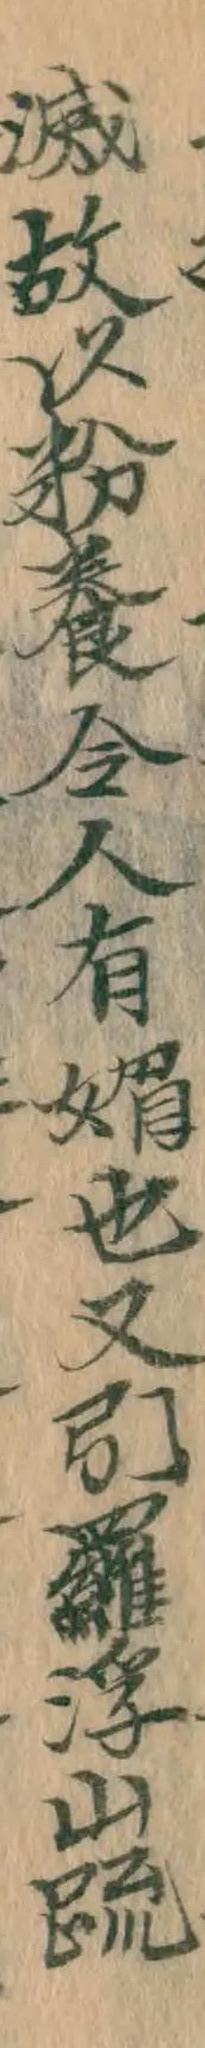滅故以粉養令人有媚也又引羅浮山䟽
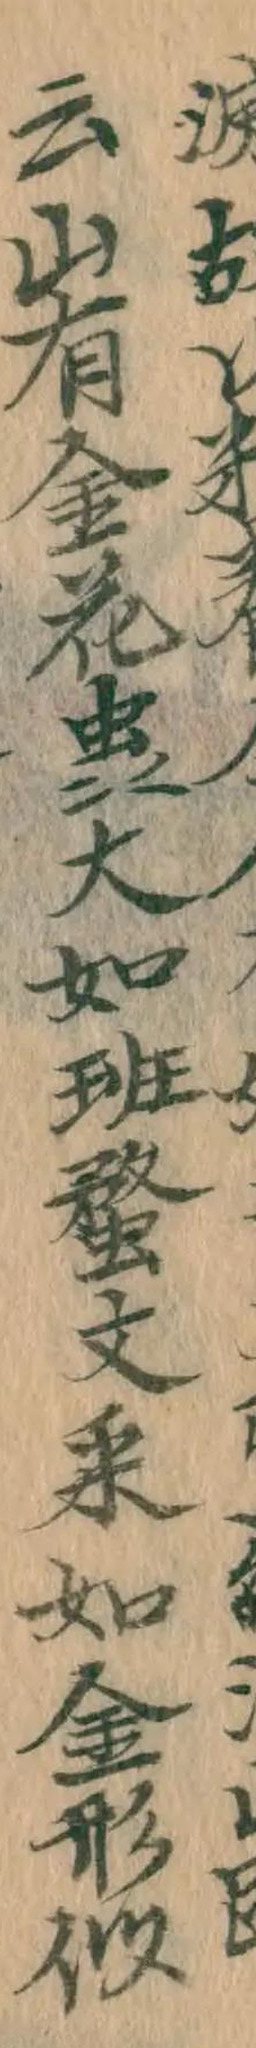云山有金花蟲大如班蝥文釆如金形似
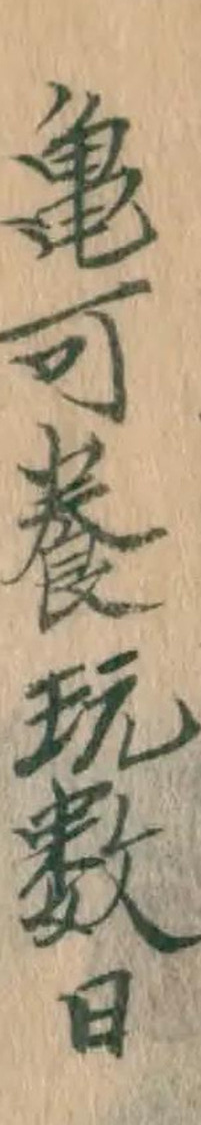亀可養玩数日
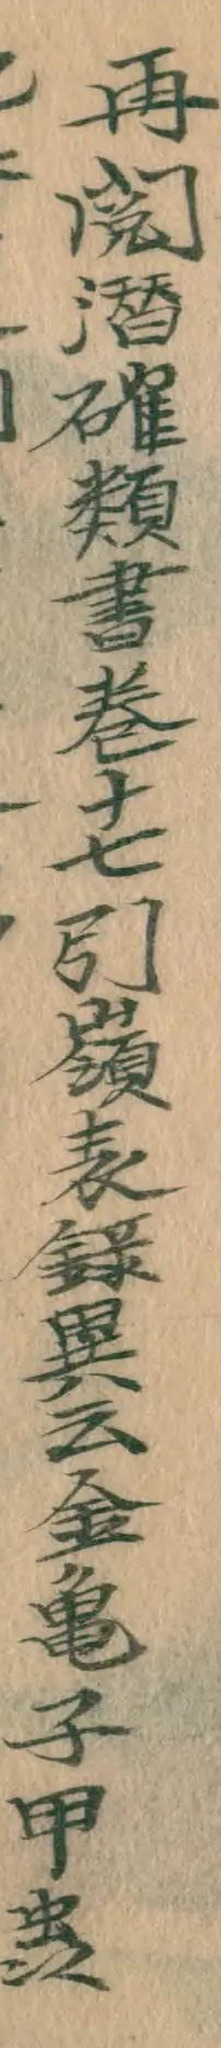再閲潜確類書巻十七引嶺表録異云金亀子甲蟲
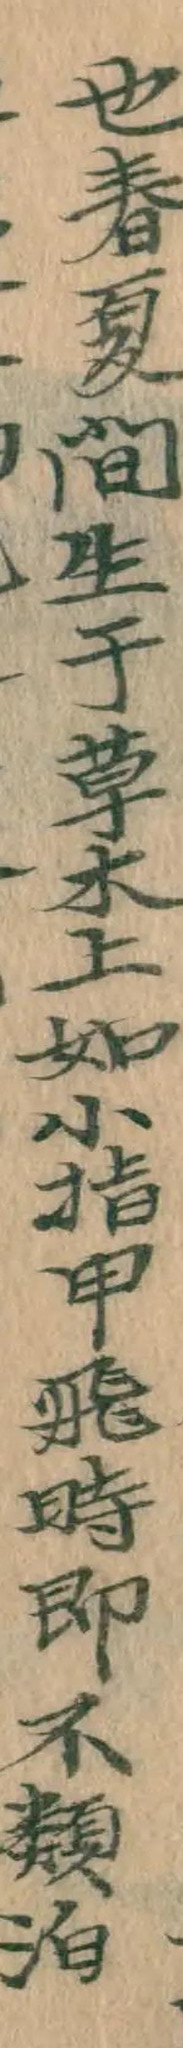也春夏間生于草木上如小指甲飛時即不類泊
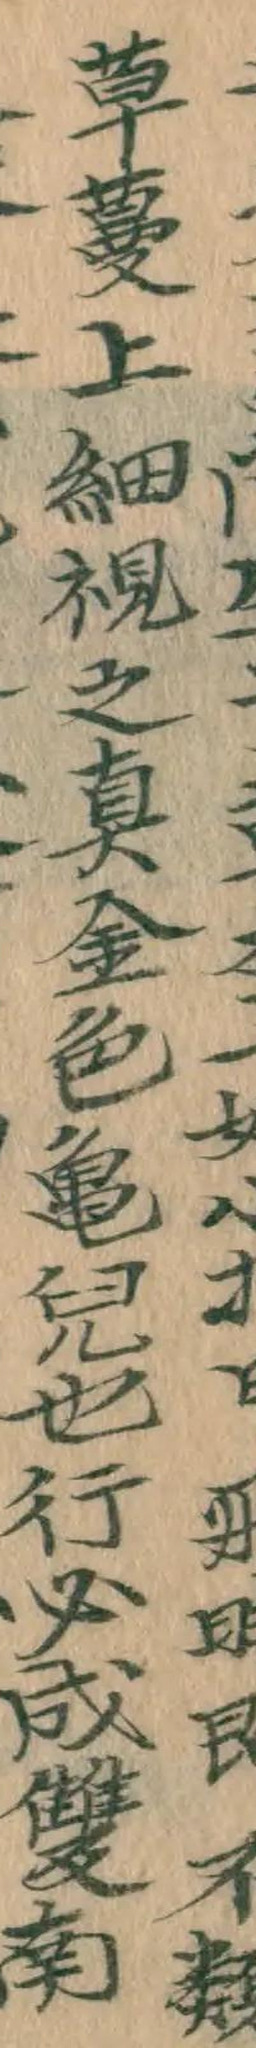草蔓上細視之真金色亀兒也行必成雙南
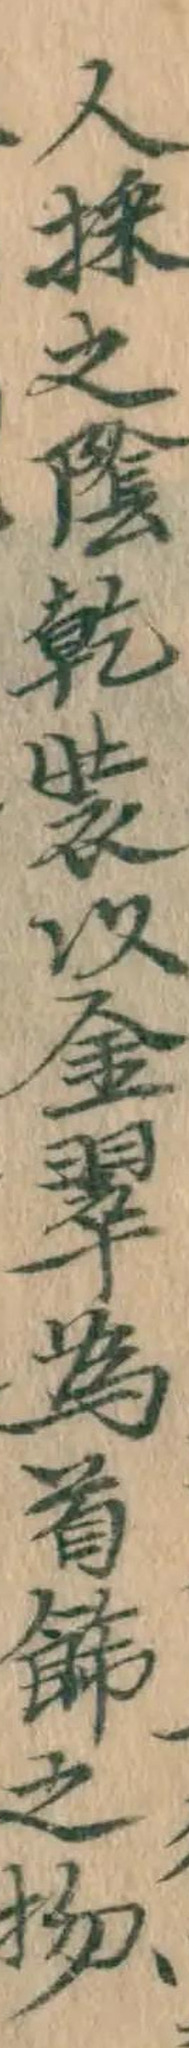人採之陰乾装以金翠為首飾之物
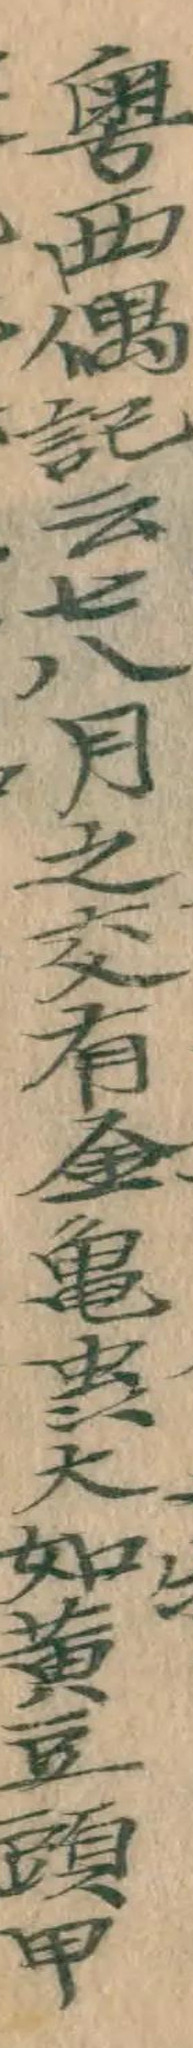粤西偶記云七八月之交有金亀蟲大如黄豆頭甲
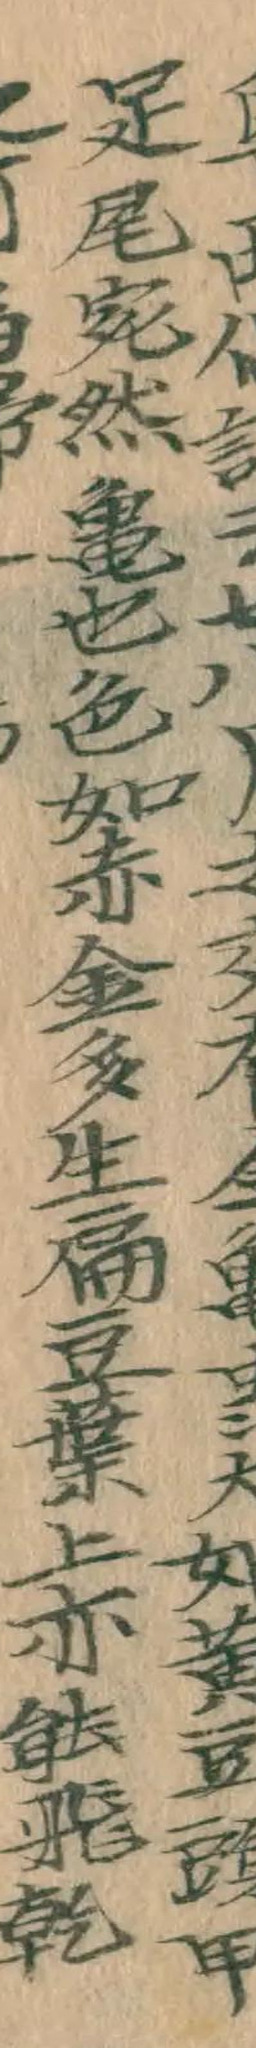足尾宛然亀也色如赤金多生扁豆葉上亦能飛乾
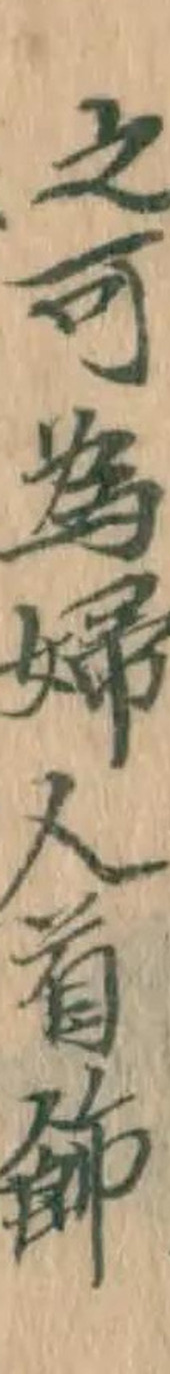之可為婦人首飾
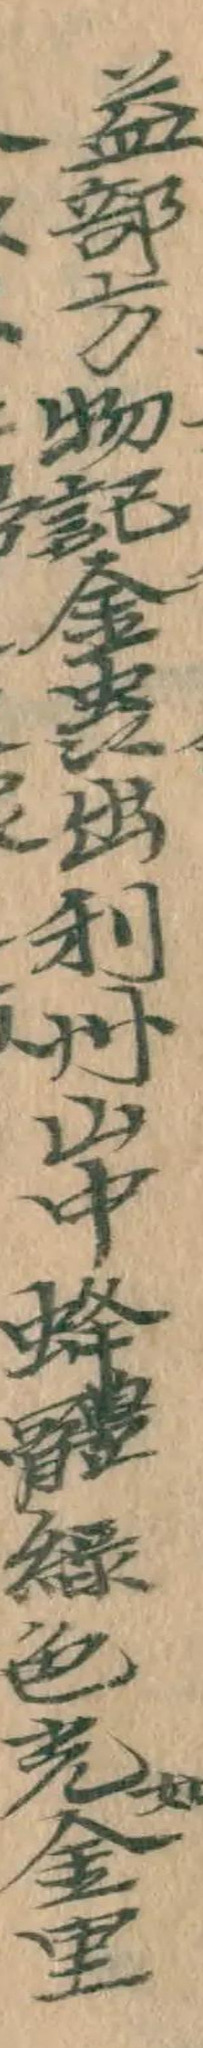益部方物記金蟲出利州山中蜂體緑色光如金里
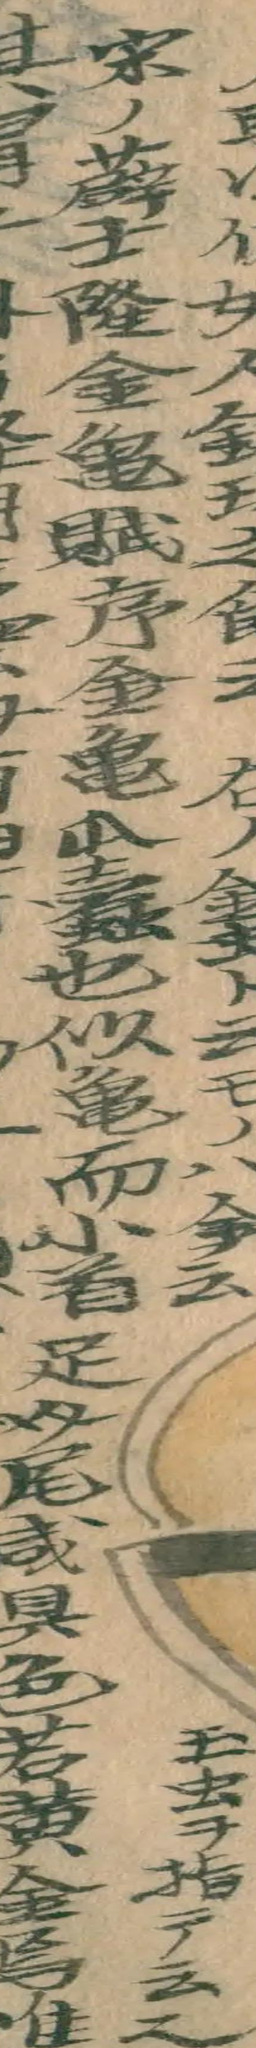宋ノ薛士隆金亀賦序金亀瓜蠧也ニ似亀而小首足介尾咸具色若黄金烏惟
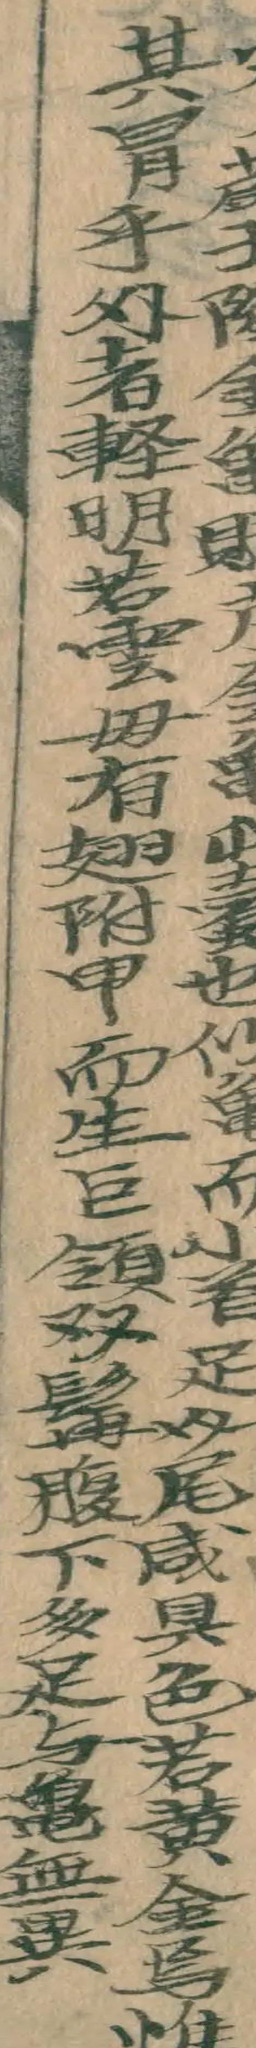其冐乎外者軽明若雲母有翅附甲而生巨領双髯腹下多足与亀無異
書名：千蟲譜 3巻. [1]
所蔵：国立国会図書館 National Diet Library, JAPAN
